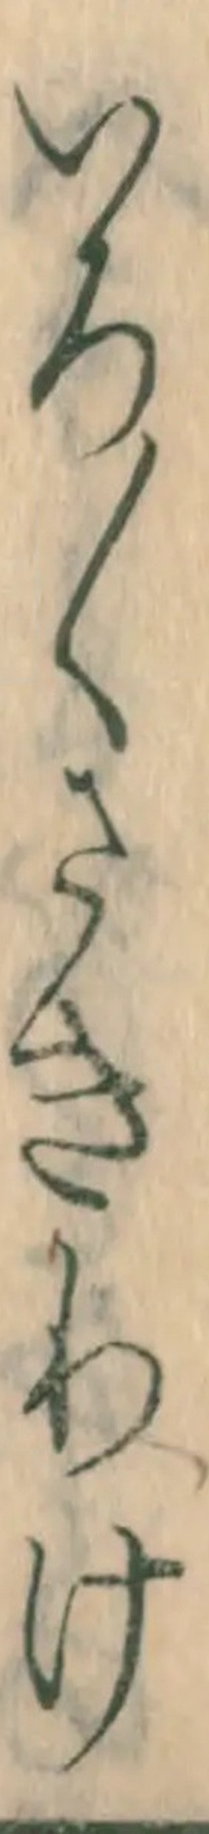いろ〳〵さきわけ
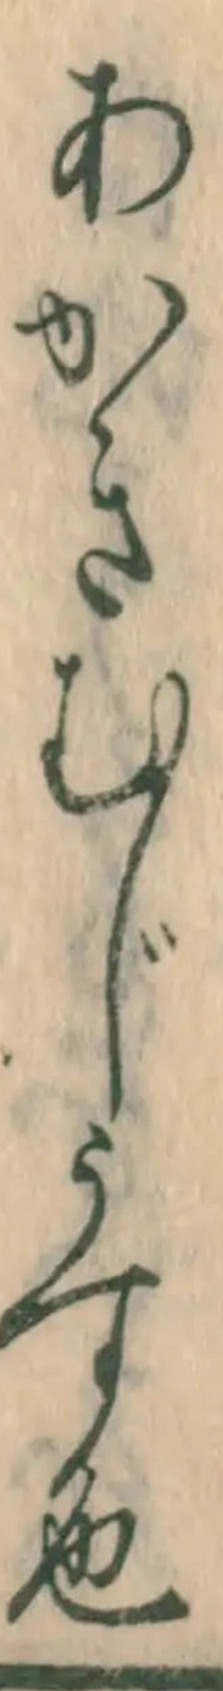あかきむじうす色
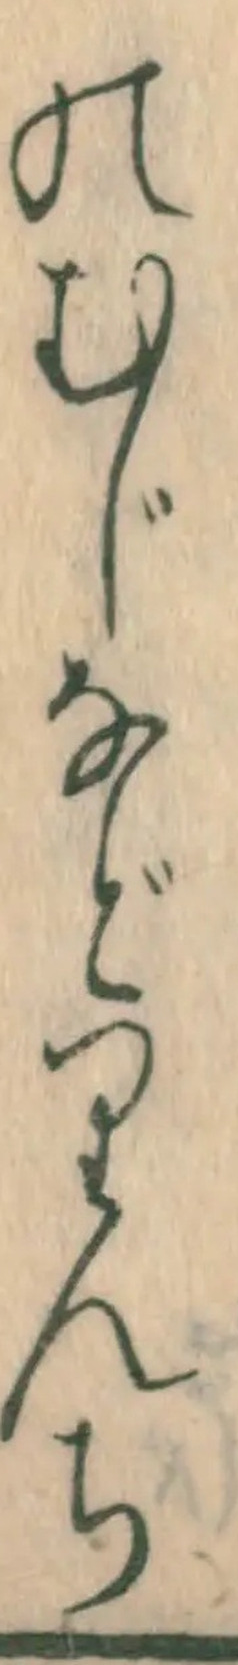のむじなどりんち
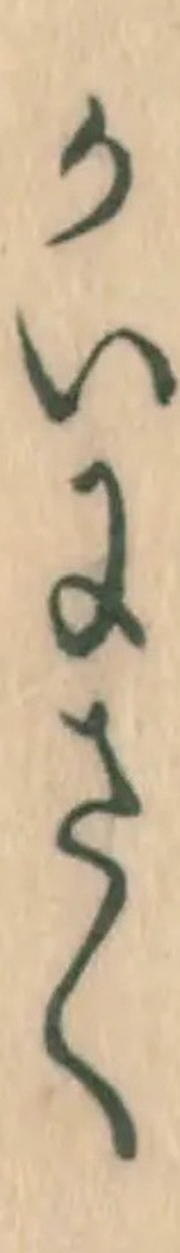かいにさく
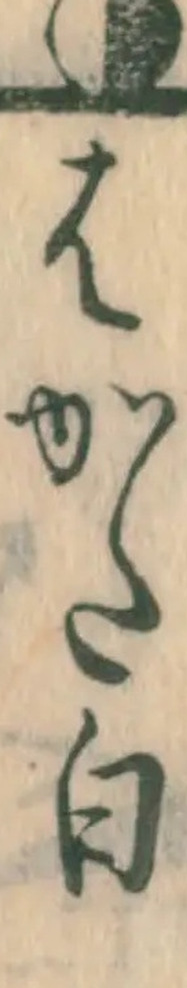はかた白
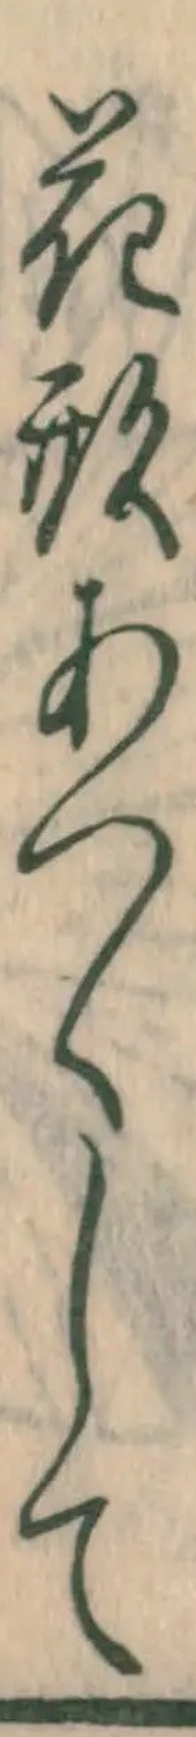花形あつくして
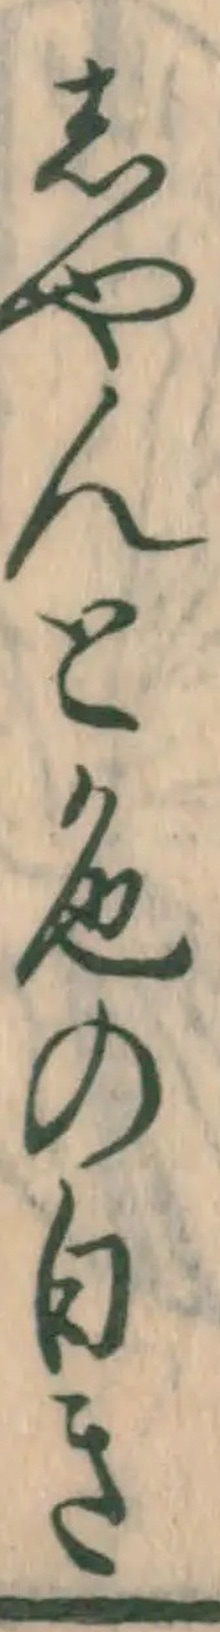しやんと色の白き
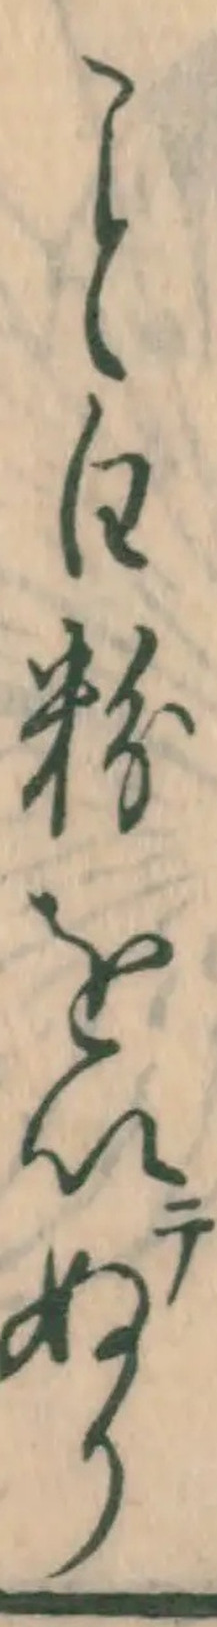こと白粉を以
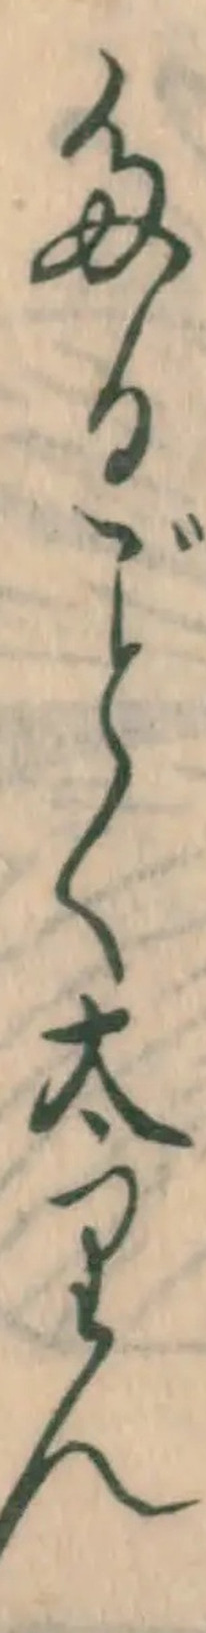たるごとく太りん
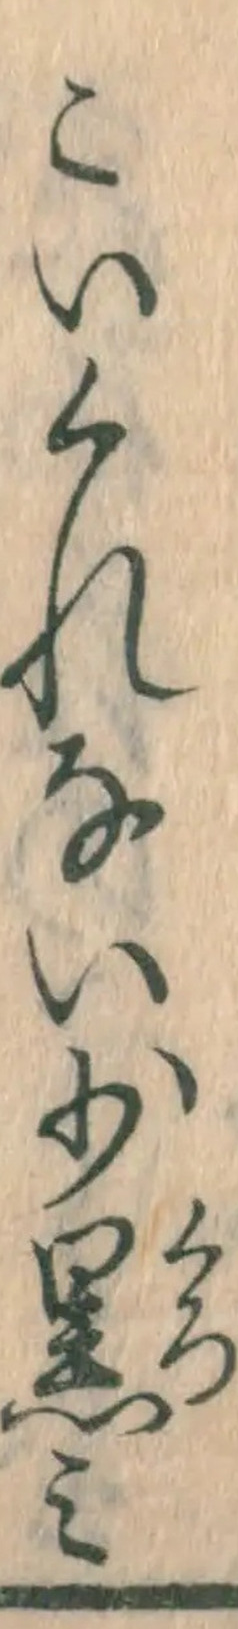こいくれない少黒み
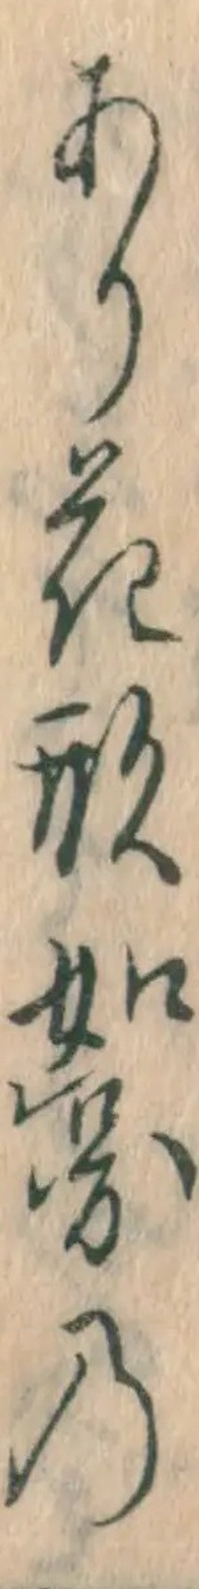あり花形如図の

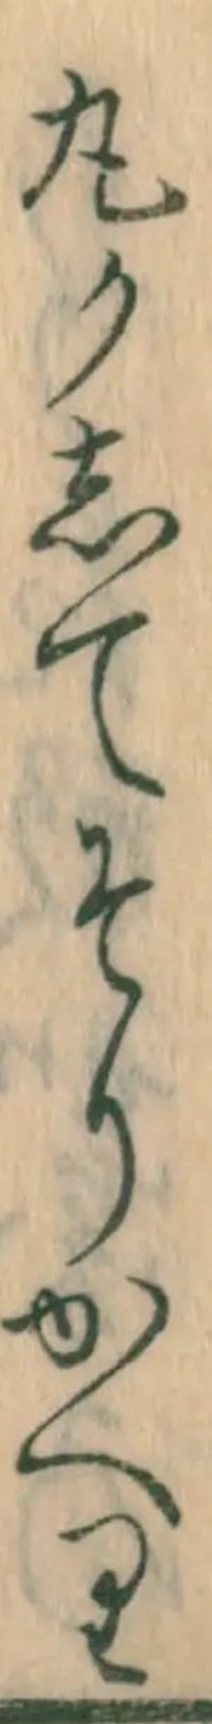丸くしてそりかへり
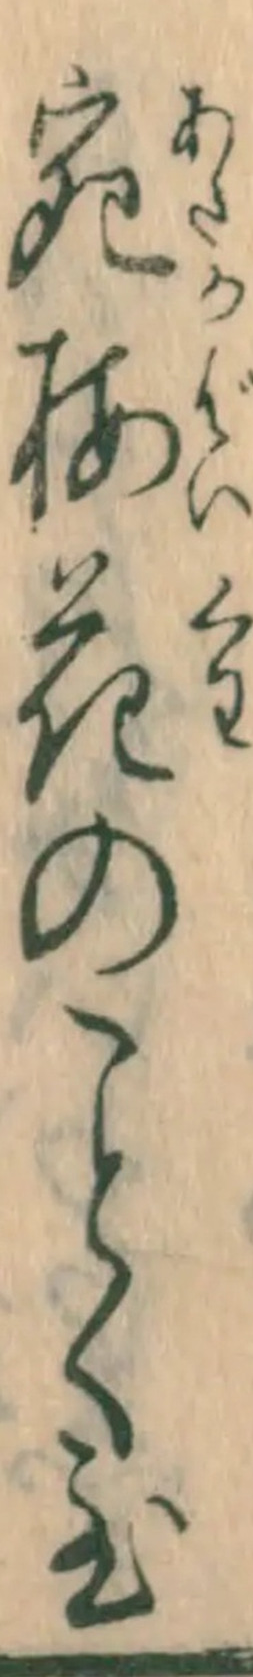宛梅花のことく至
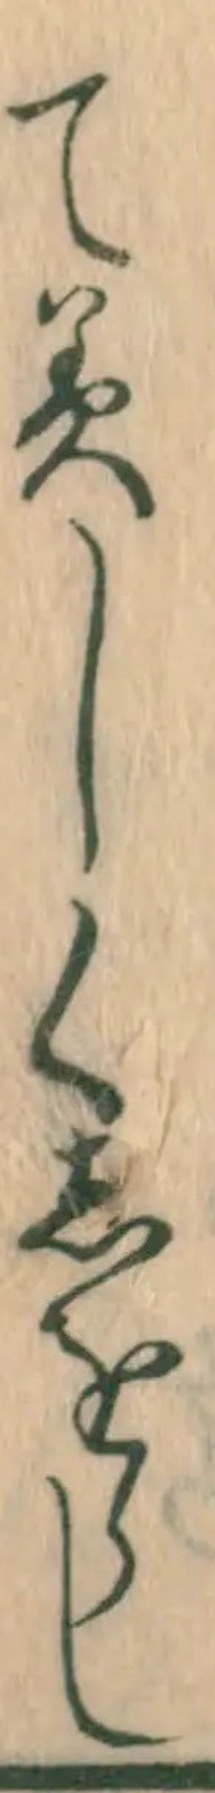て美しくしをらし
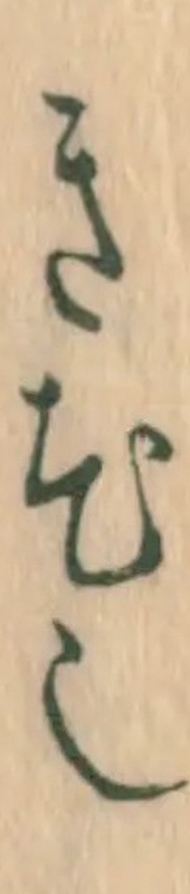き花也
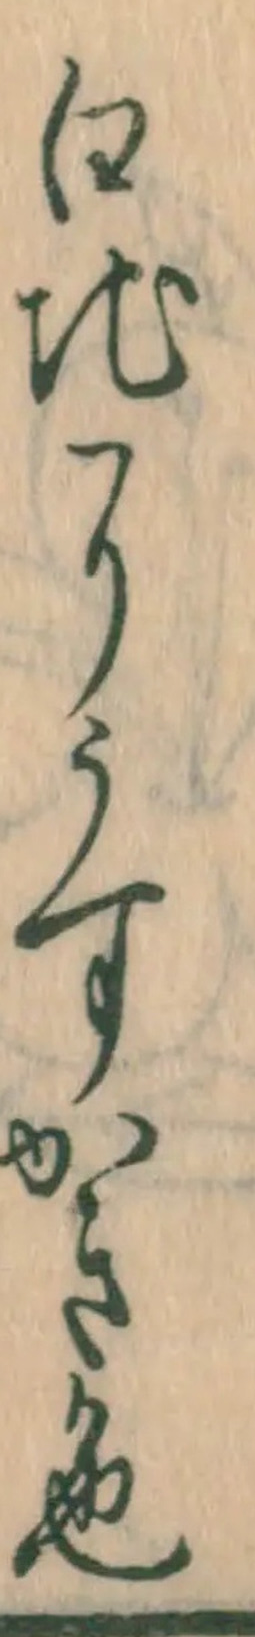白地にうすかき色
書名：錦繍枕 5巻. [4]
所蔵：国立国会図書館 National Diet Library, JAPAN
